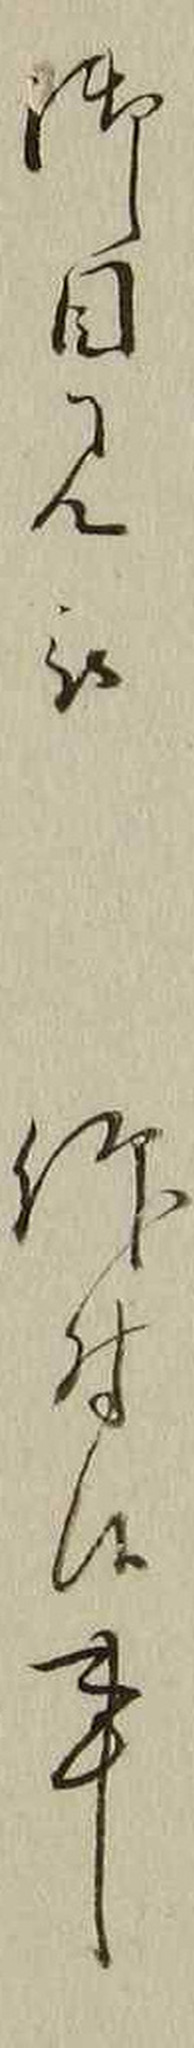御目見被仰付候事
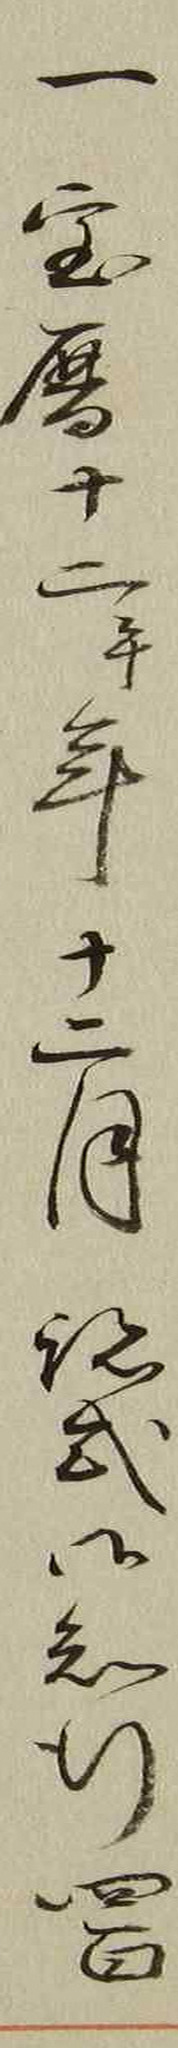一宝暦十二午年十二月跡式御知行四百
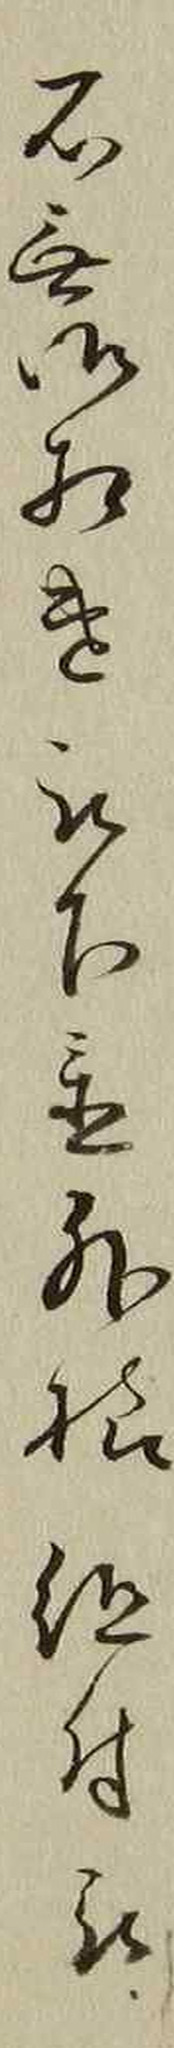石無御相違被下置外様組付被
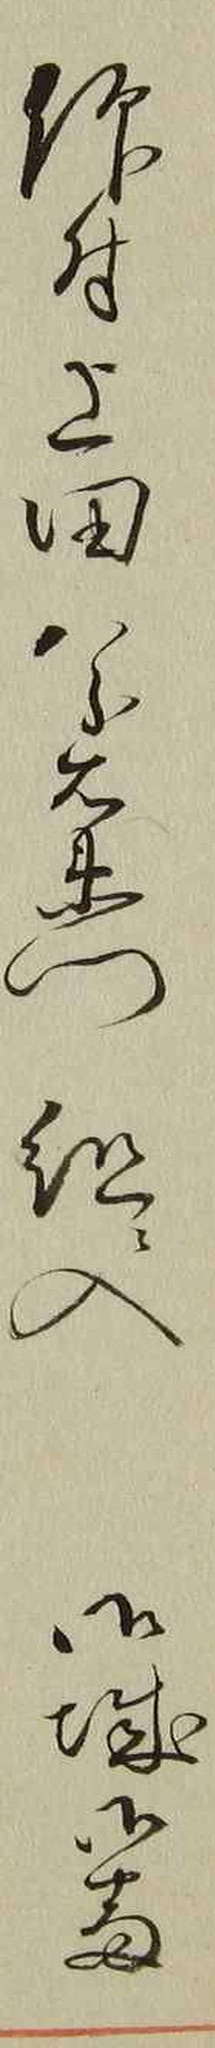仰付上田八郎右衛門組ニ入御城御番
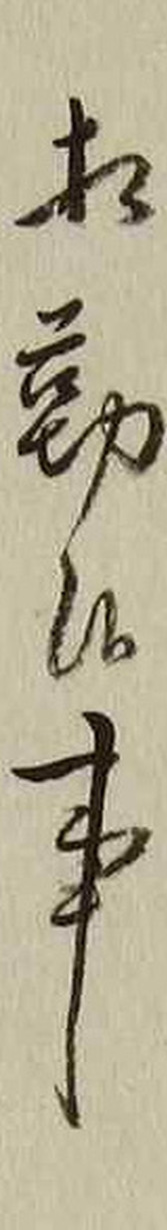相勤候事
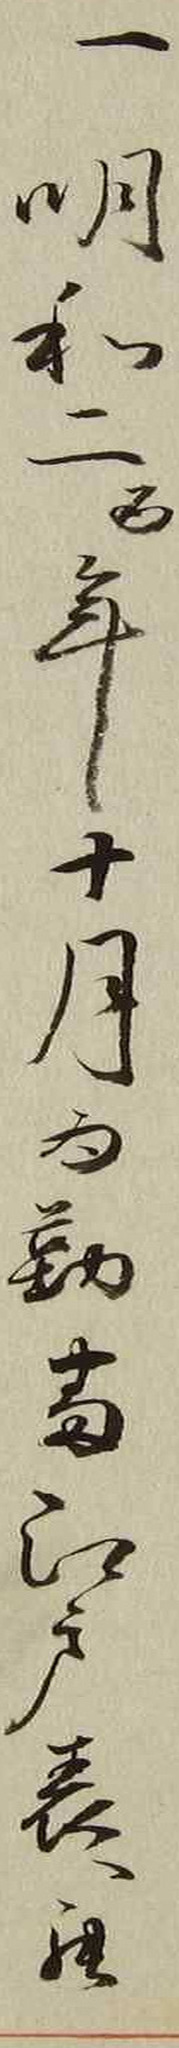一明和二酉年十月為勤番江戸表へ罷
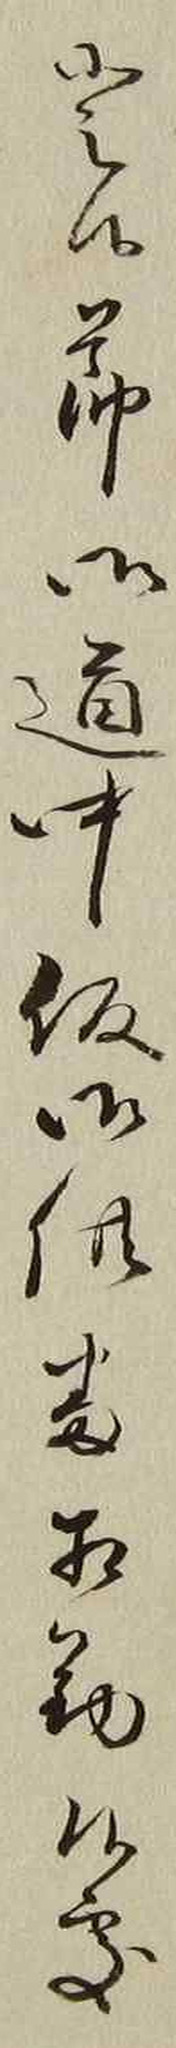登候節御道中仮御供番相勤候処
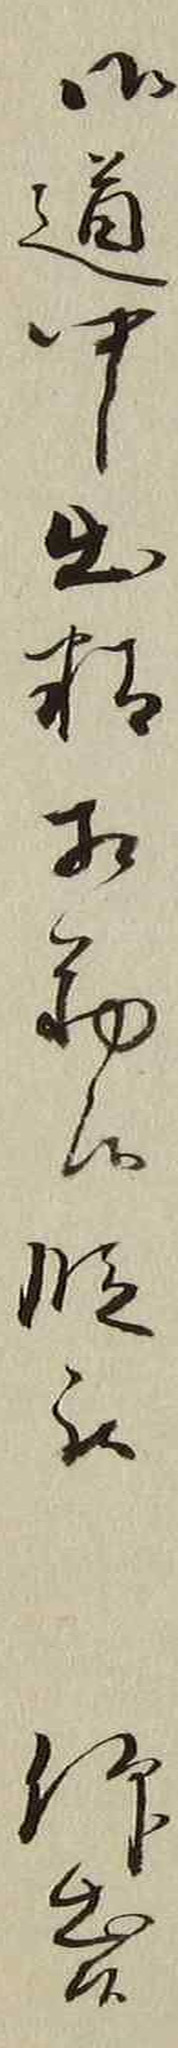御道中出精相勤候段被仰出候
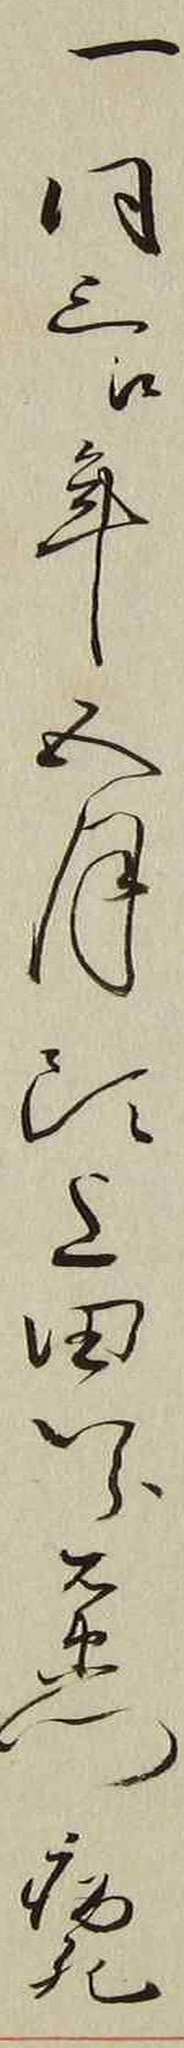一同三江年五月頭上田八郎右衛門病死
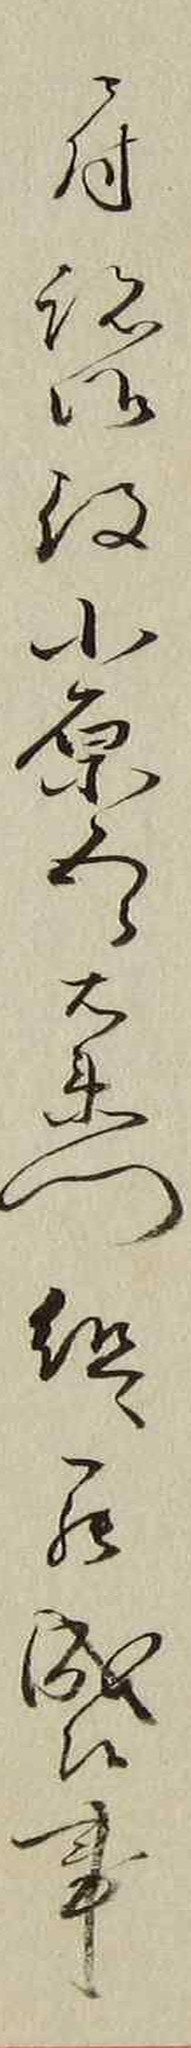ニ付跡御役小原五郎右衛門組へ罷成候事
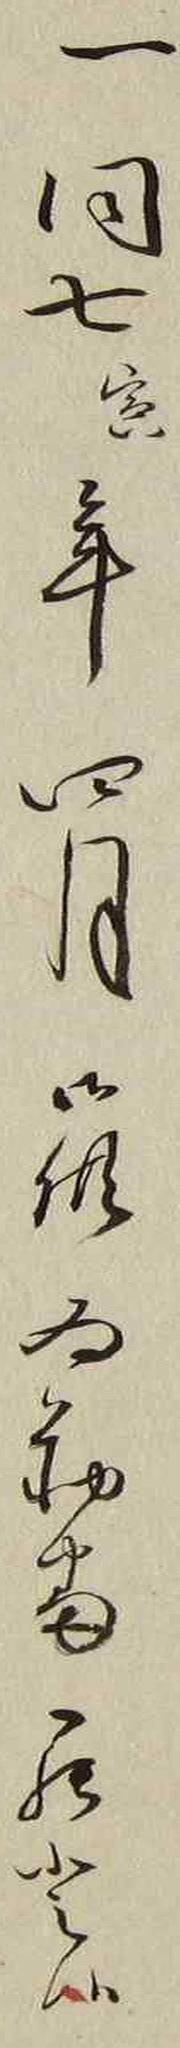一同七寅年四月御供為勤番罷登候
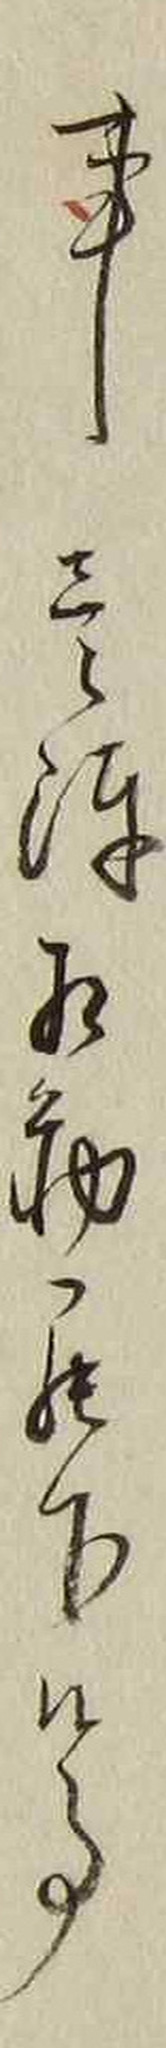事壱陣相勤罷下候事
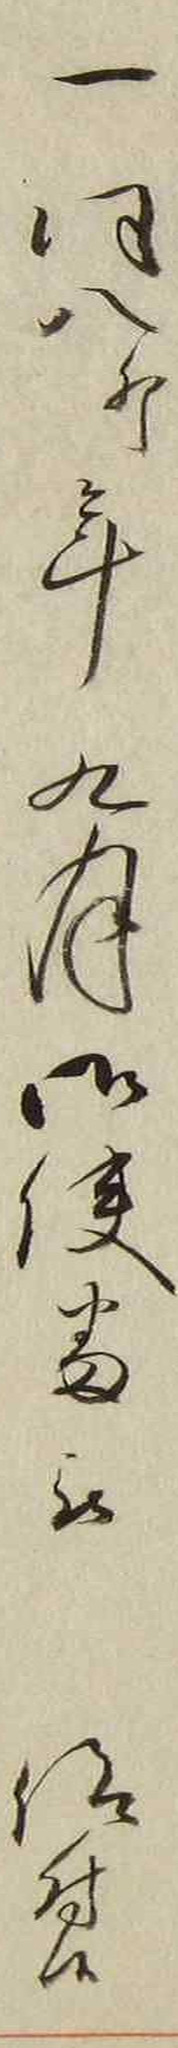一同八卯年九月御使番被仰付候

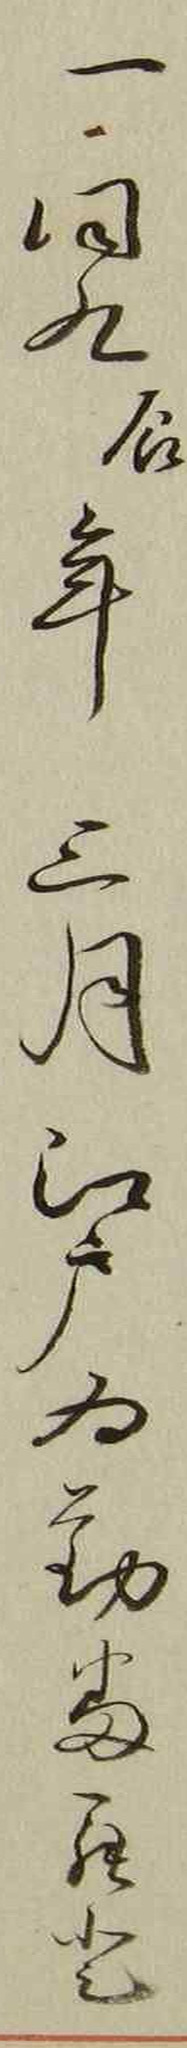一同九辰年三月江戸為勤番罷登
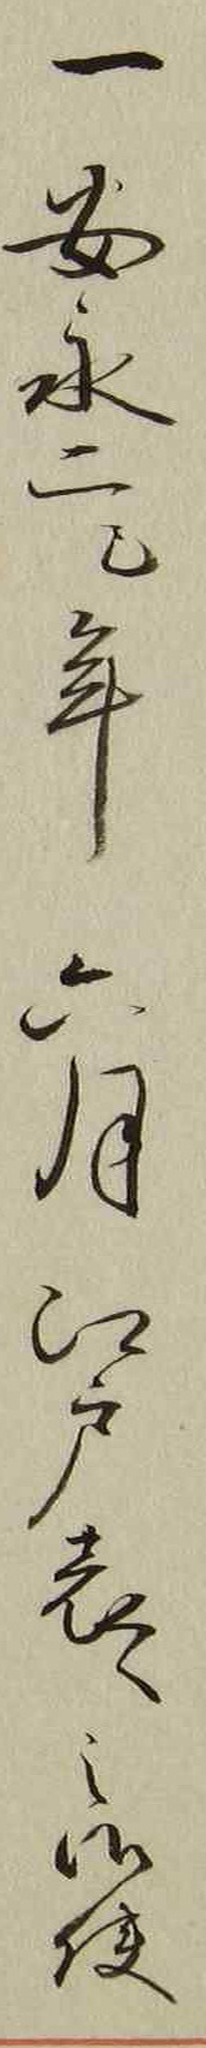一安永二巳年六月江戸表へ之御使
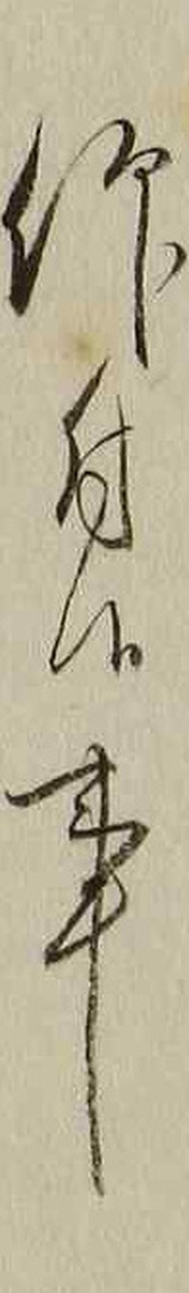仰付候事
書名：諸士系譜　巻之2　い之部2
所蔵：会津若松市立会津図書館
